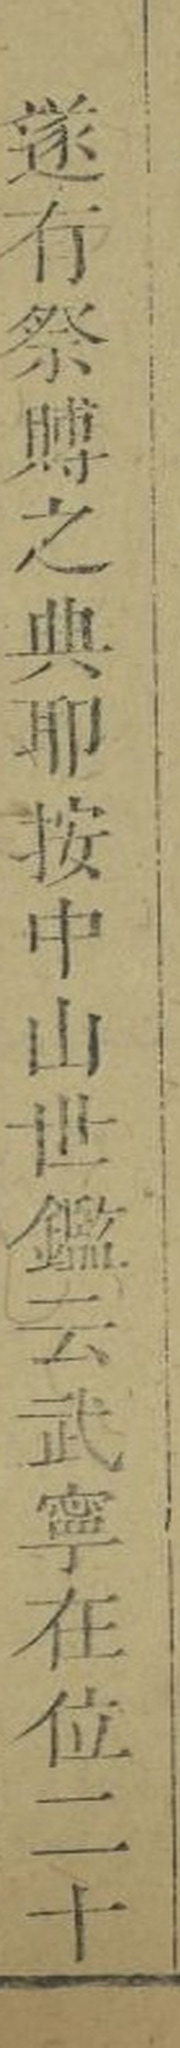遂有祭賻之典耶按中山世鑑云武寧在位二十
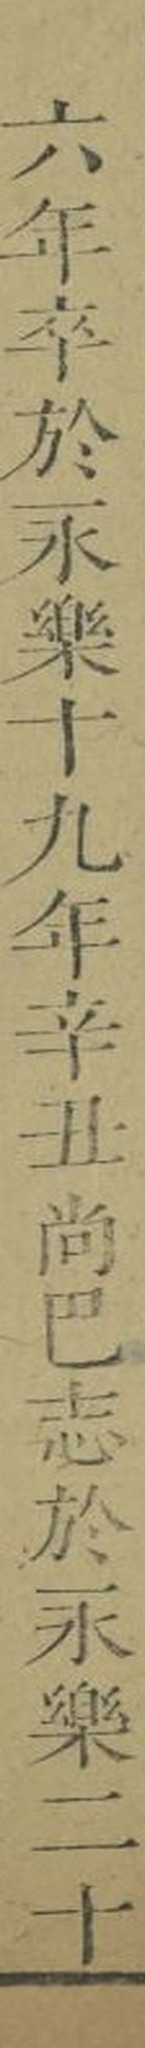六年卒於永楽十九年辛丑尚巴志於永楽二十
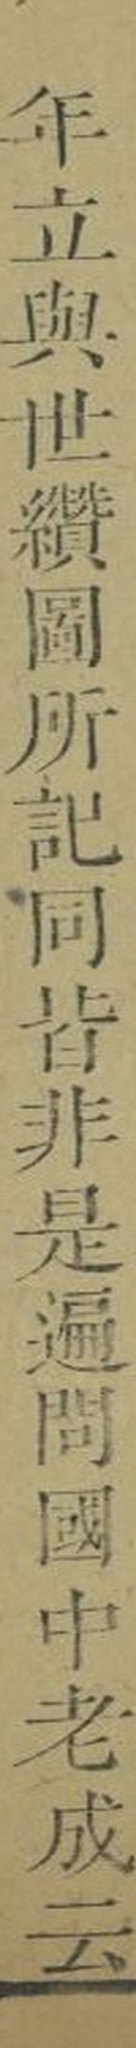年立与世纘図所記同皆非是遍問国中老成云
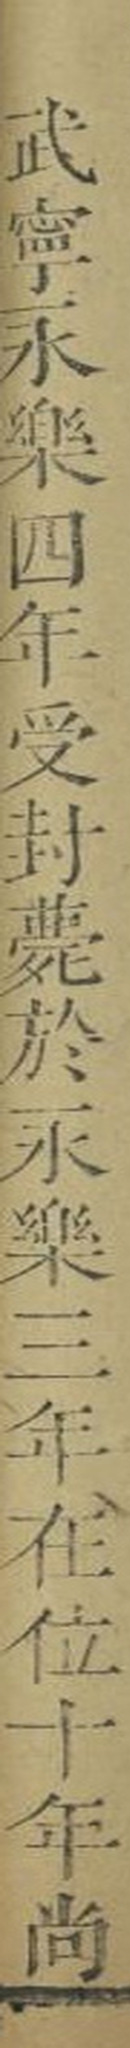武寧永楽四年受封薨於永楽三年在位十年尚
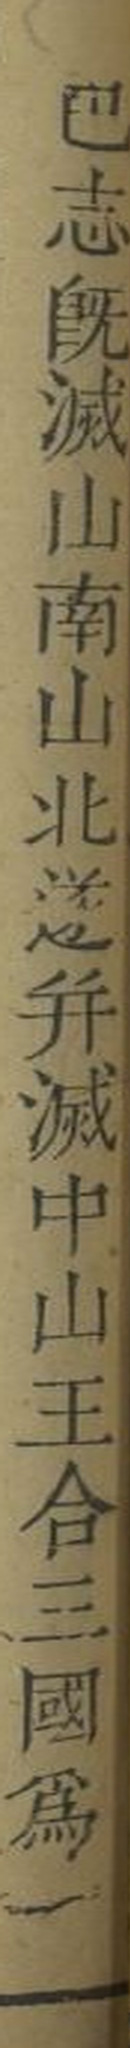巴志既滅山南山北遂并滅中山王合三国為一
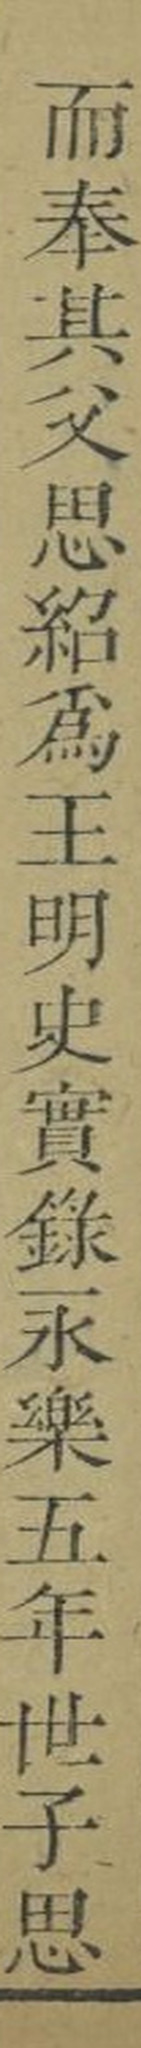而奉其父思紹為王明史実録永楽五年世子思
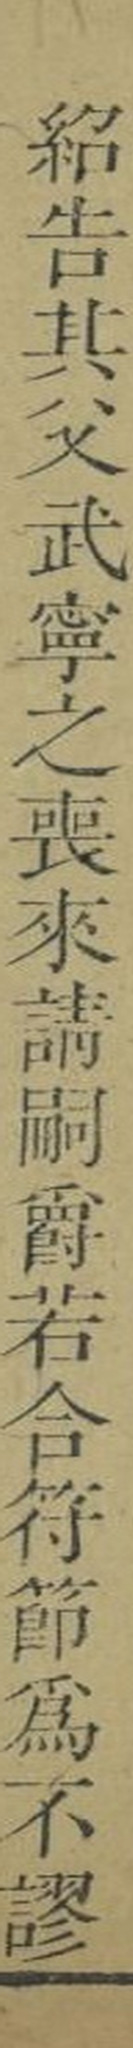紹告其父武寧之喪来請嗣爵若合符節為不謬
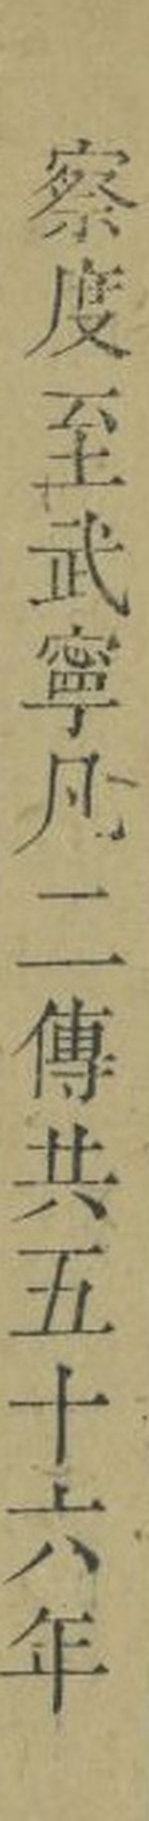察度至武寧凡二伝共五十六年
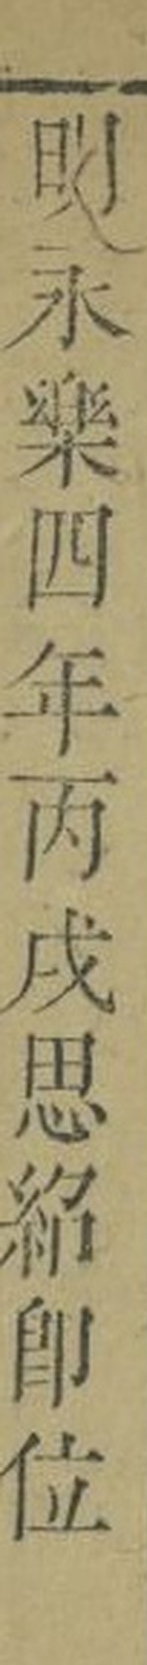明永楽四年丙戌思紹即位
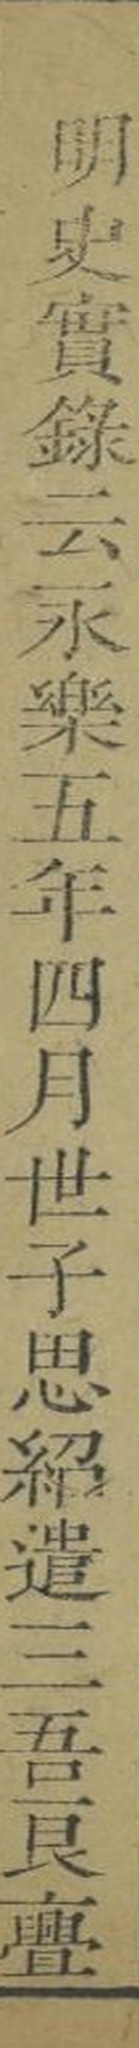明史実録云永楽五年四月世子思紹遣三吾良亹
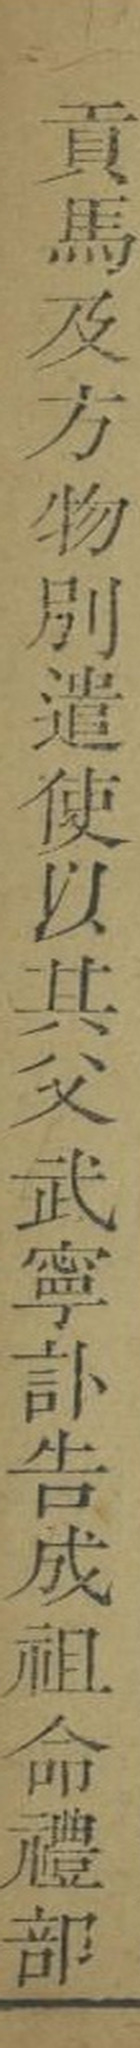貢馬及方物別遣使以其父武寧訃告成祖命礼部

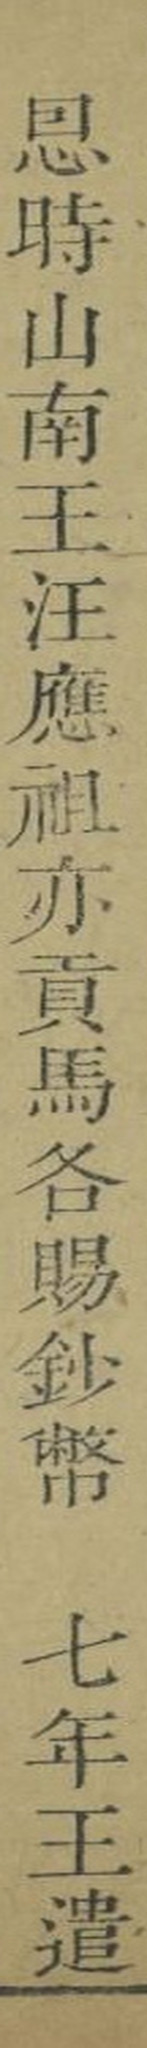恩時山南王汪応祖亦貢馬各賜鈔幣七年王遣
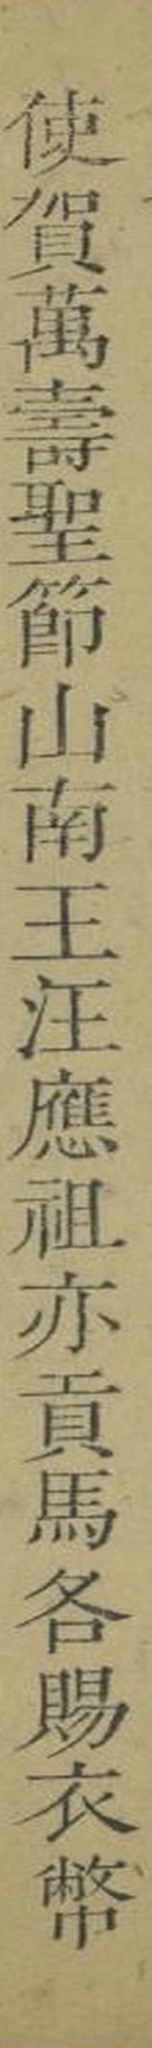使賀万寿聖節山南王汪応祖亦貢馬各賜衣幣
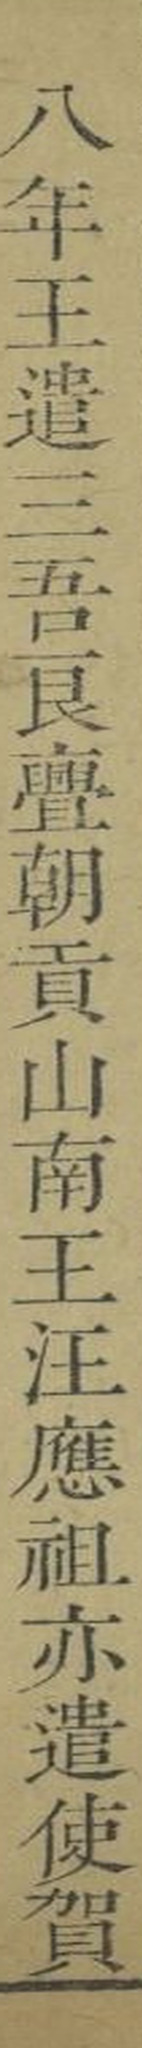八年王遣三吾良亹朝貢山南王汪応祖亦遣使賀
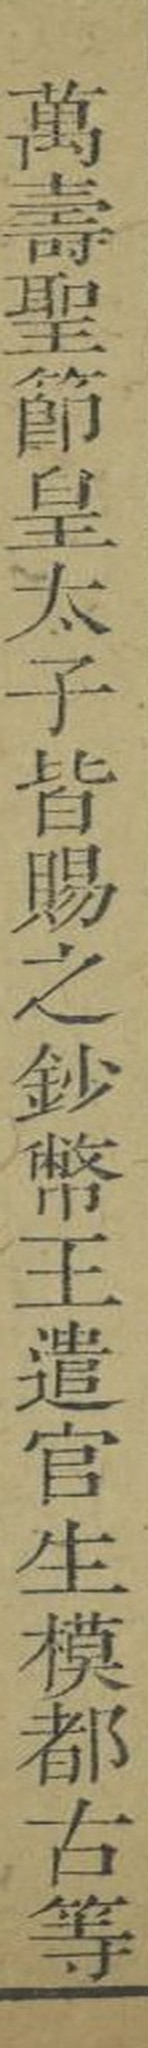万寿聖節皇太子皆賜之鈔幣王遣官生模都古等
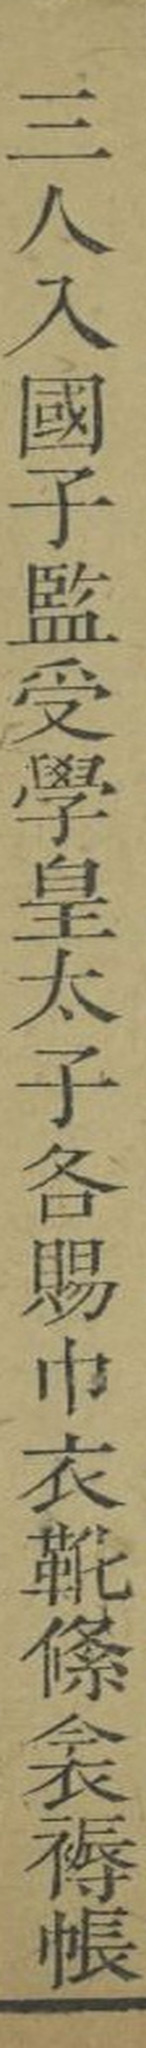三人入国子監受学皇太子各賜巾衣靴絛衾褥帳
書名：中山伝信録 巻三
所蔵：University of the Ryukyus Library
